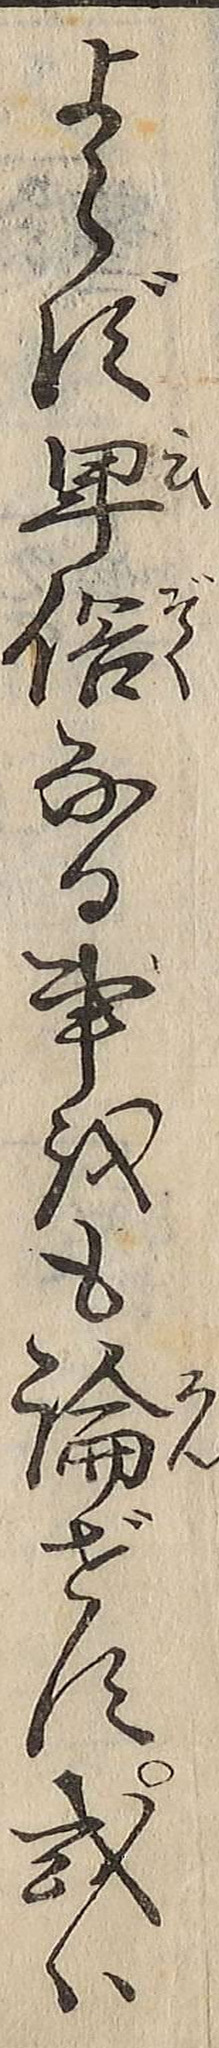よらず卑俗なる事をも論ぜす。或は
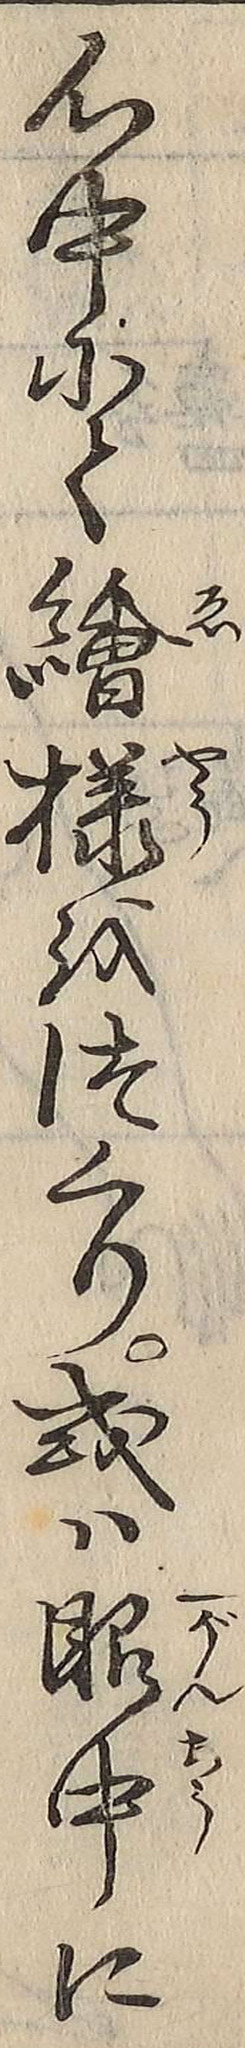心中にて絵様をつくり。或は眼中に
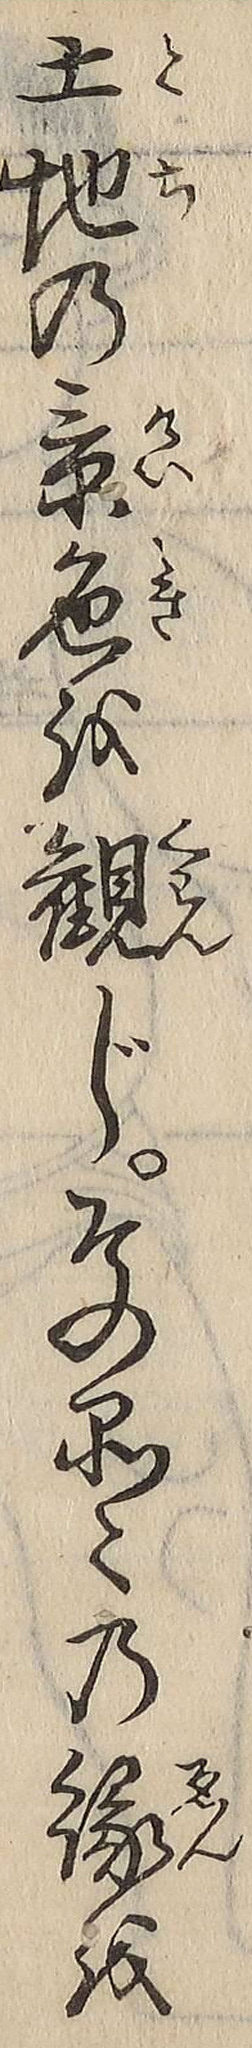土地の景色を観じ。その品々の縁を
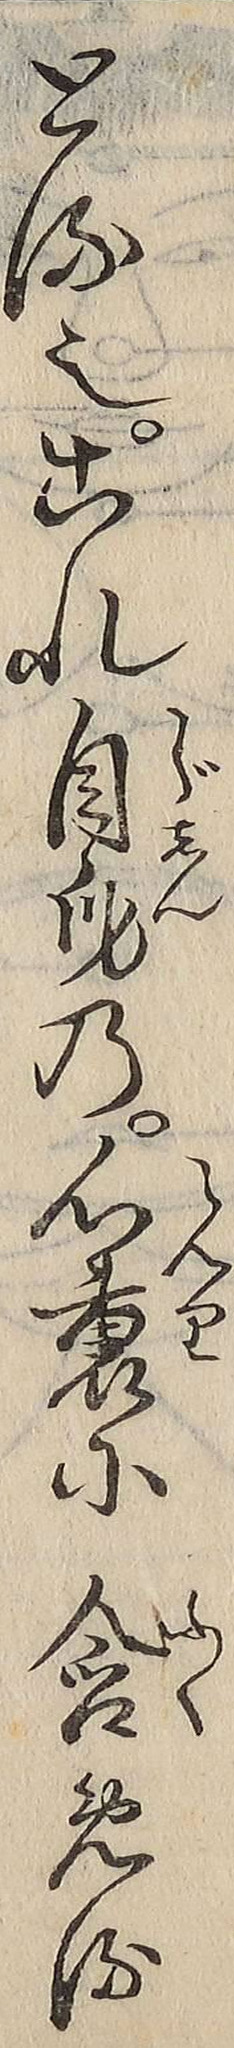とる也。これ自身の。心裏に含める
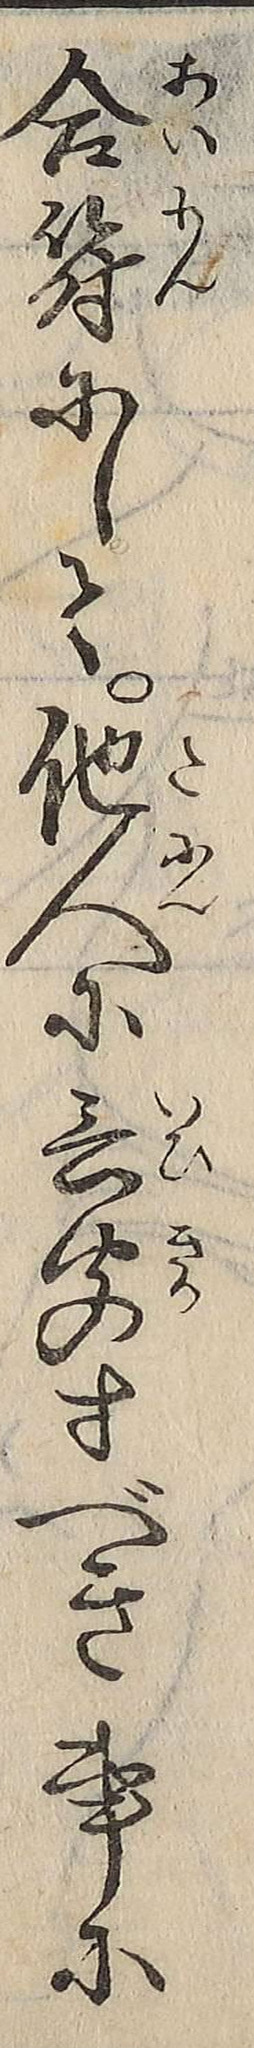合符にして。他人に言聞すべき事に
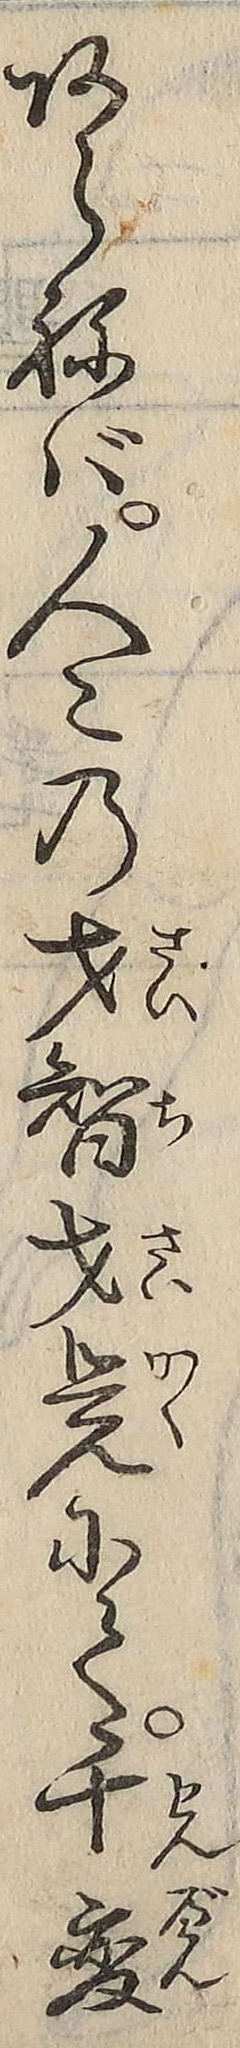あらねば。人々の才智才覚にて。千変
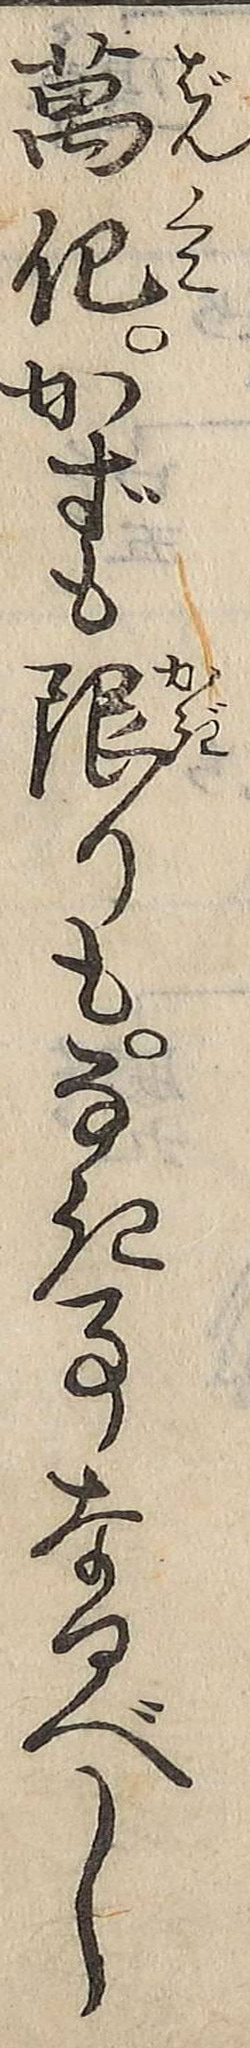万化。かずも限りも。なき事なるべし

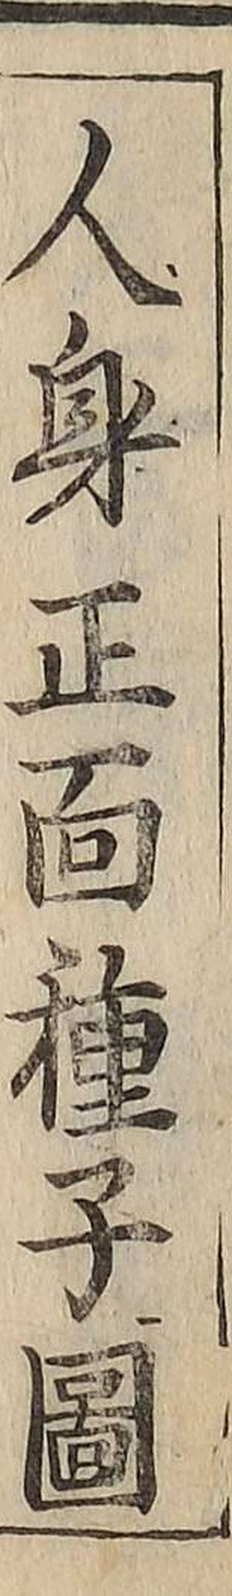人身正面種子図
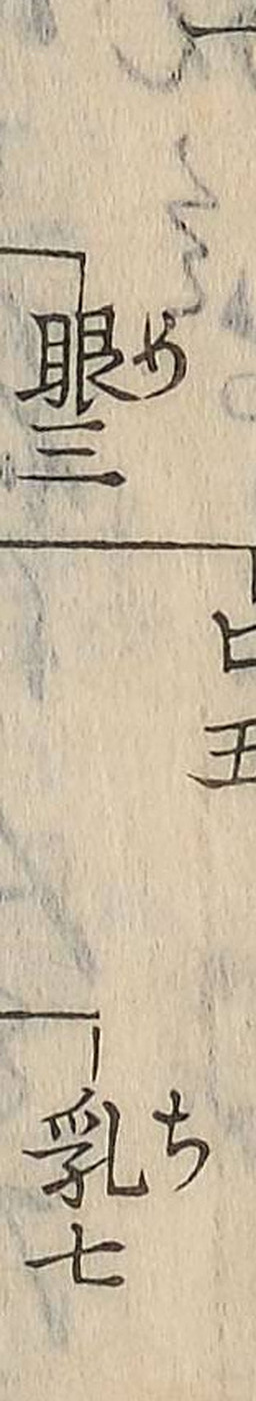眼三乳七
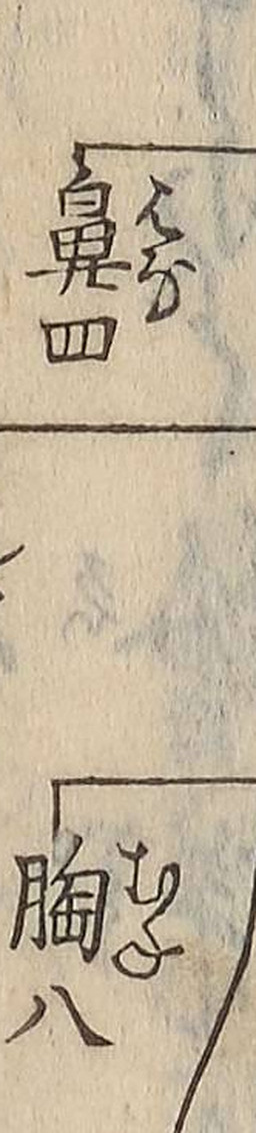鼻四胸八
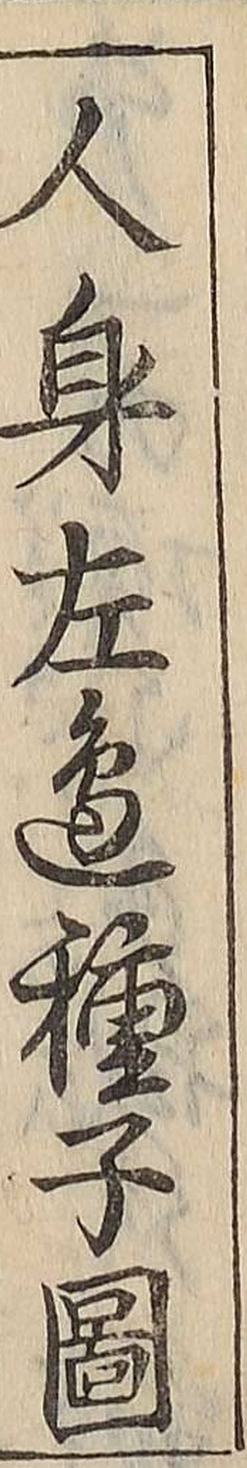人身正面種子図

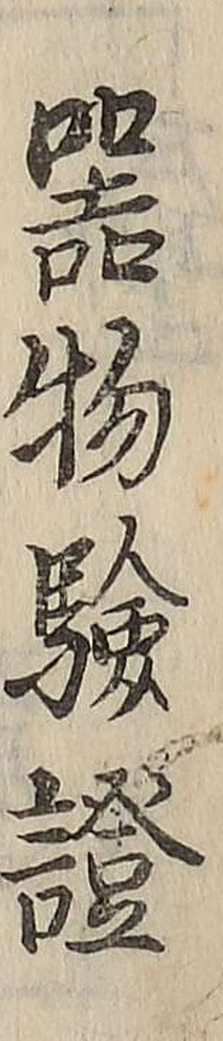器物験證
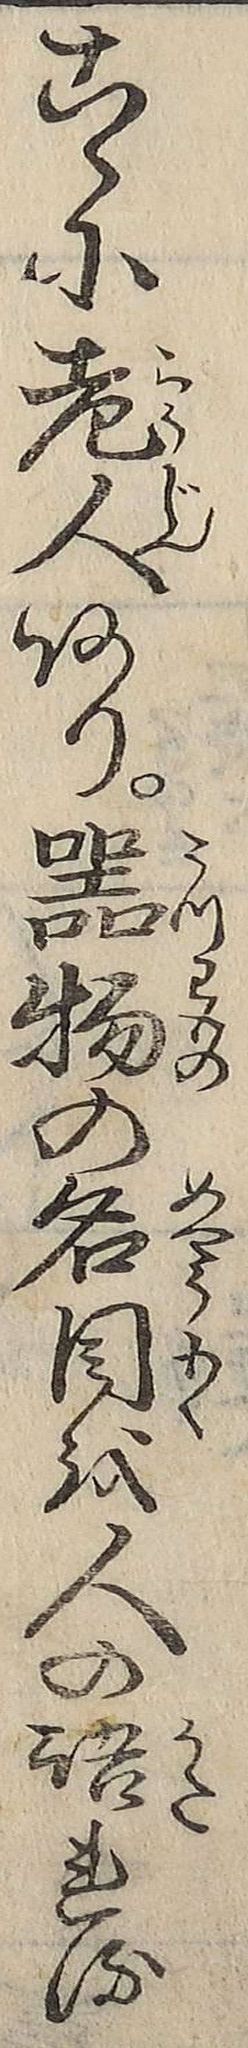こゝに老人あり。器物の名目を人の語れる
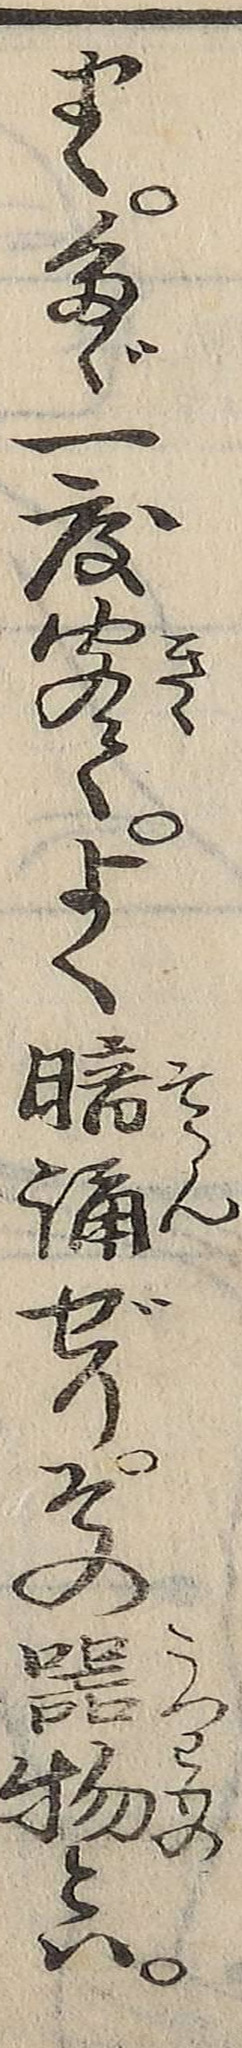まゝ。たゞ一度聞て。よく暗誦ぜり。その器物とは。
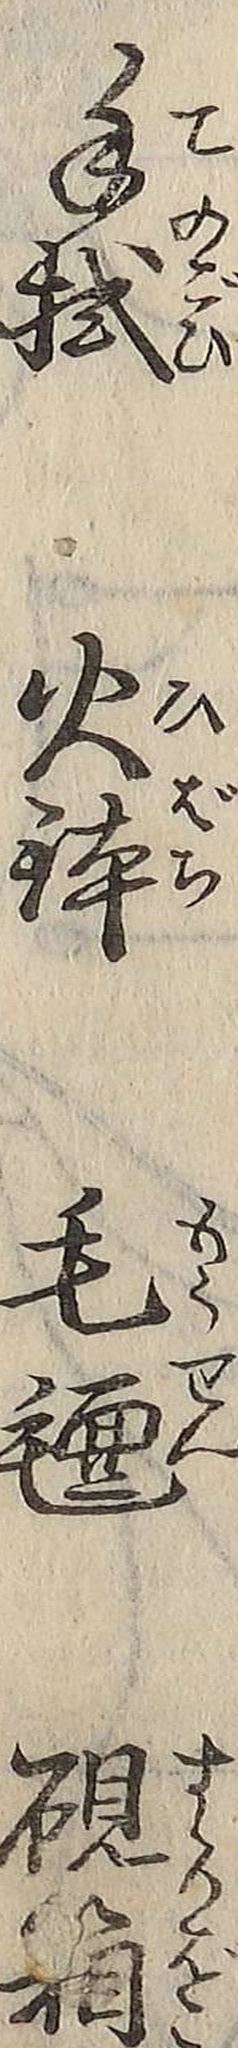手拭火鉢毛氈硯箱
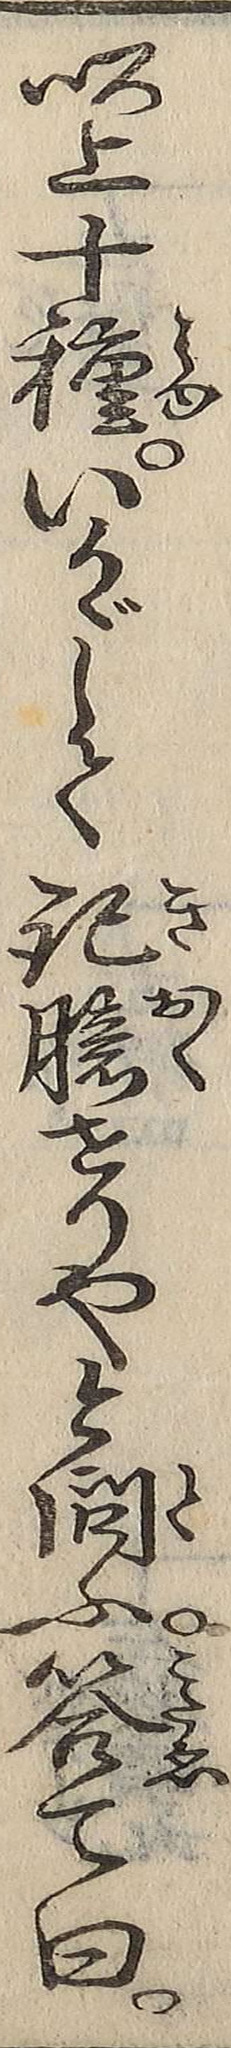以上十種。いかゞして記臆せりやと問ふ。答て曰。
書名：物覺秘傳
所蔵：神戸大学附属図書館 国文学研究資料館
